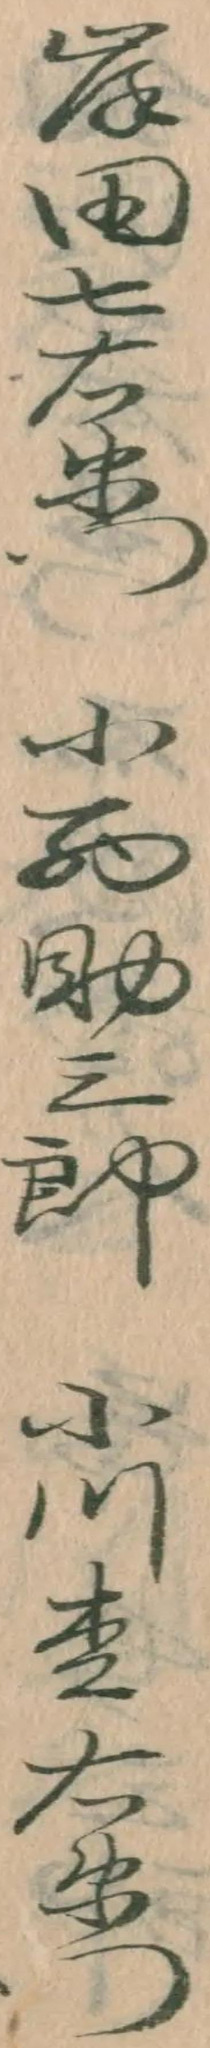岸田七右衛門小西助三郎小川杢右衛門
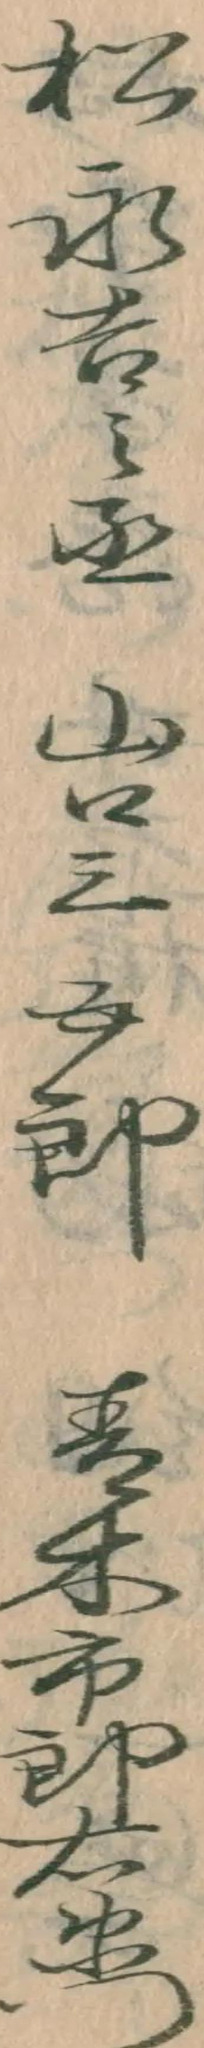松永吉之丞山口三五郎青木市郎右衛門
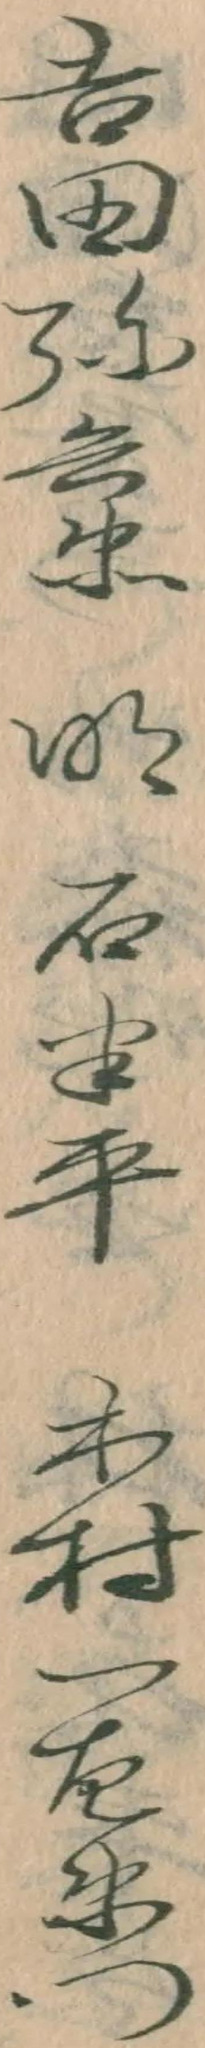吉田弥兵衛明石半平木村一左衛門
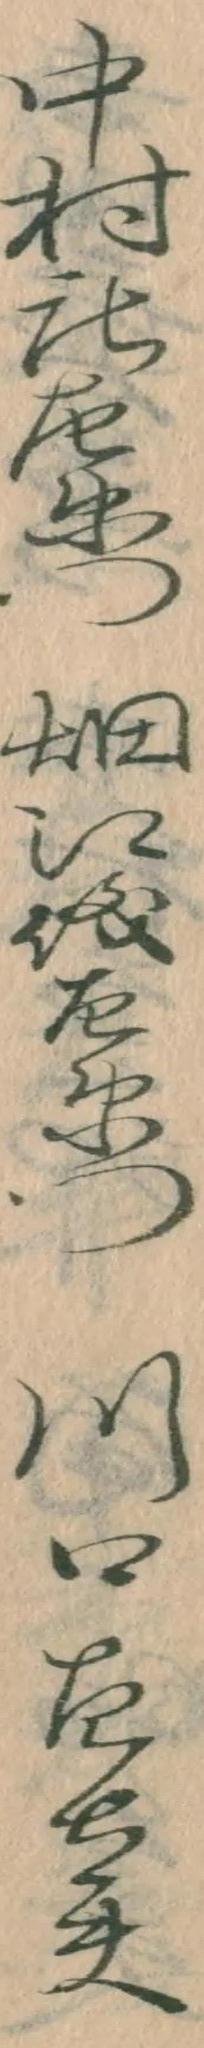中村庄左衛門畑江儀左衛門川口左太夫
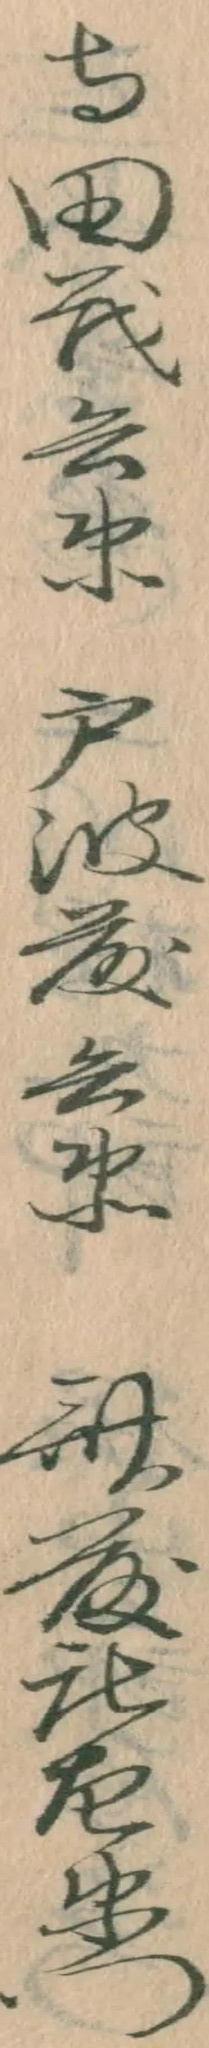寺田茂兵衛戸波藤兵衛斎藤庄左衛門
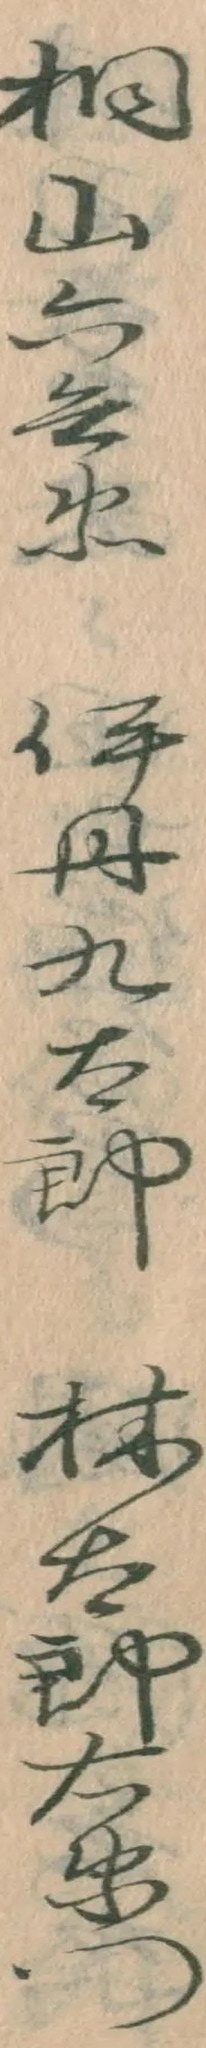桐山六兵衛伊丹九太郎林太郎右衛門
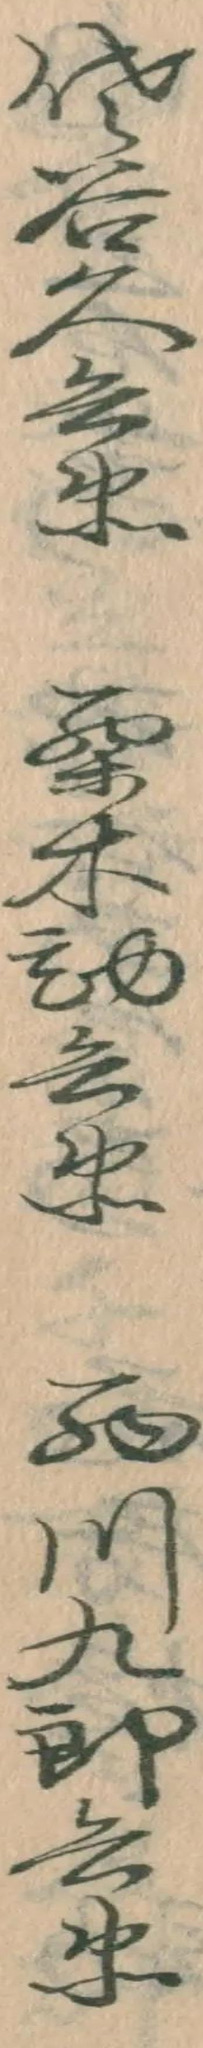佐谷久兵衛栗木勘兵衛西川九郎兵衛
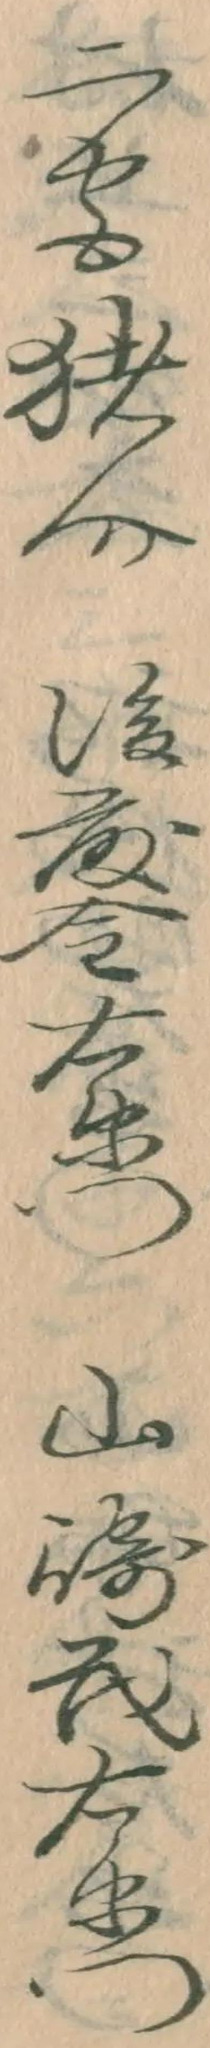二宮猪介後藤金右衛門山崎茂右衛門

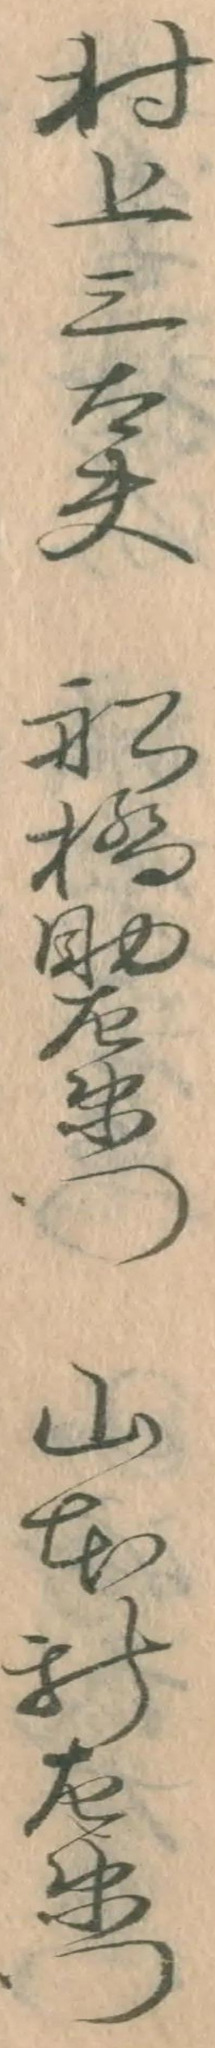村上三太夫舩橋助左衛門山本新左衛門
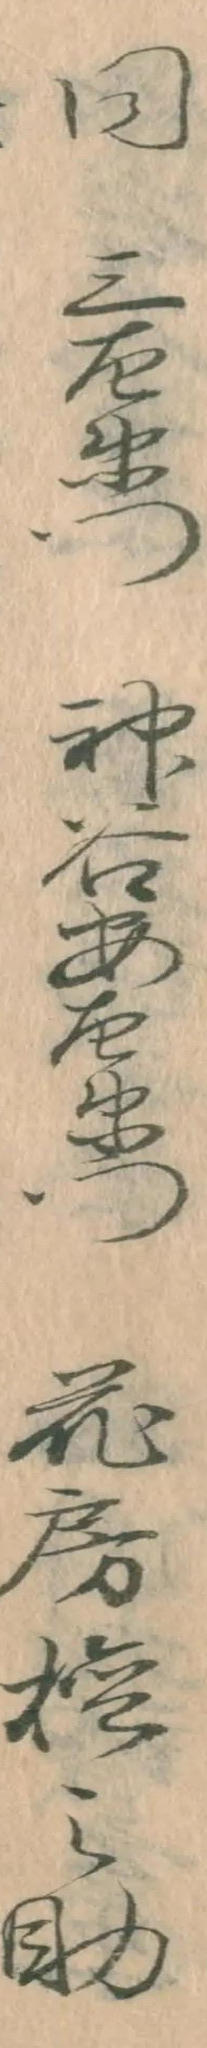同三左衛門神谷安左衛門花房権之助
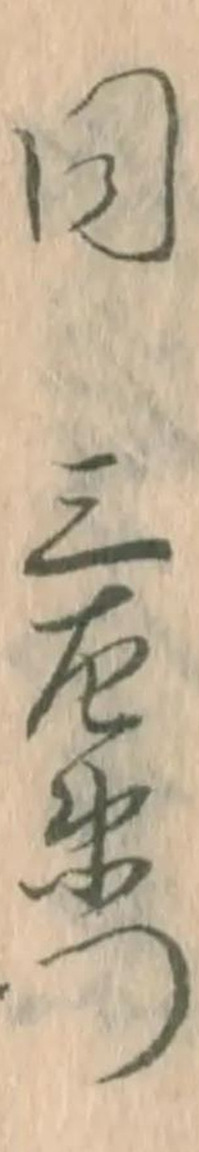辻金左衛門
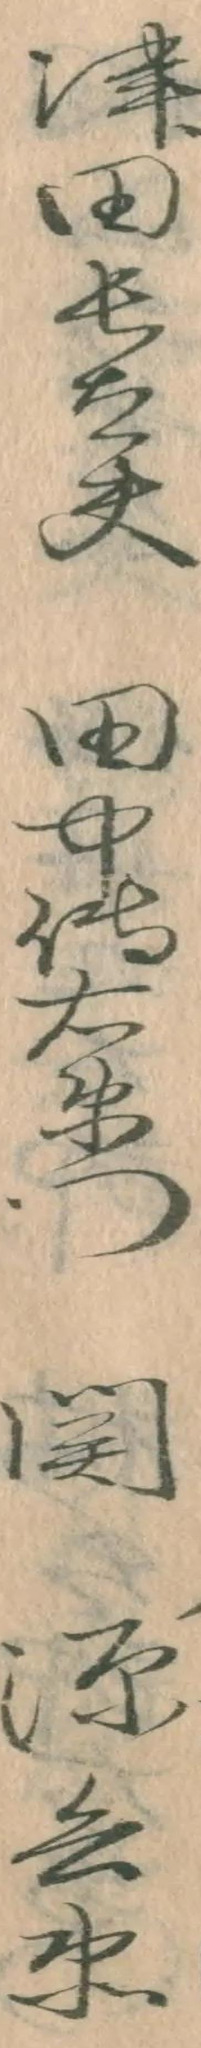津田長太夫田中伝右衛門関源兵衛
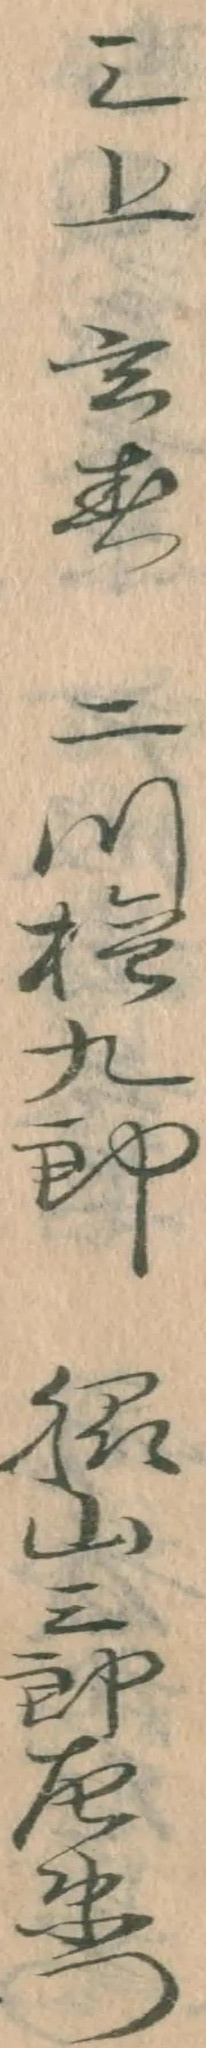三上玄春二川権九郎脇山三郎左衛門
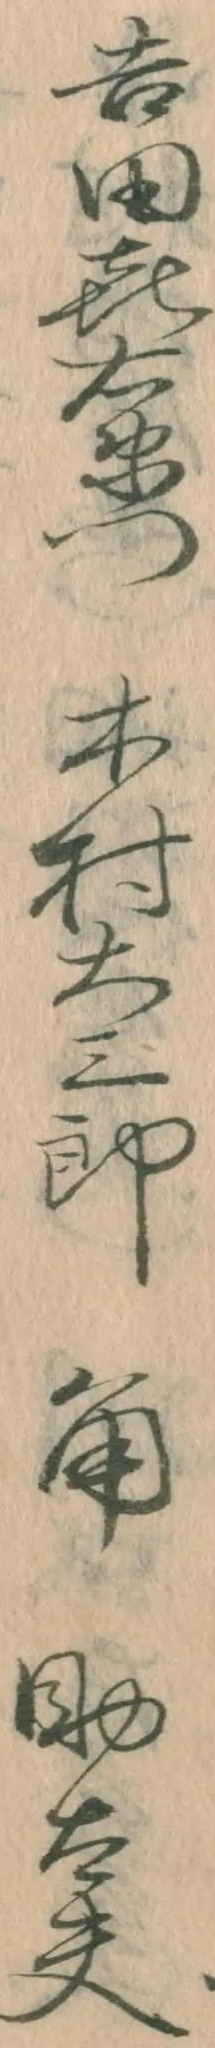吉田喜右衛門木村大三郎角助太夫
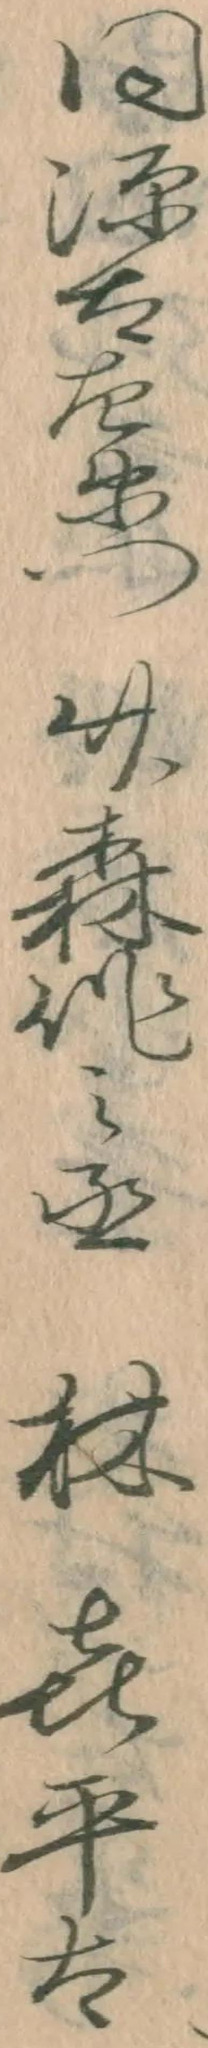同源太左衛門竹森作之丞林喜平太
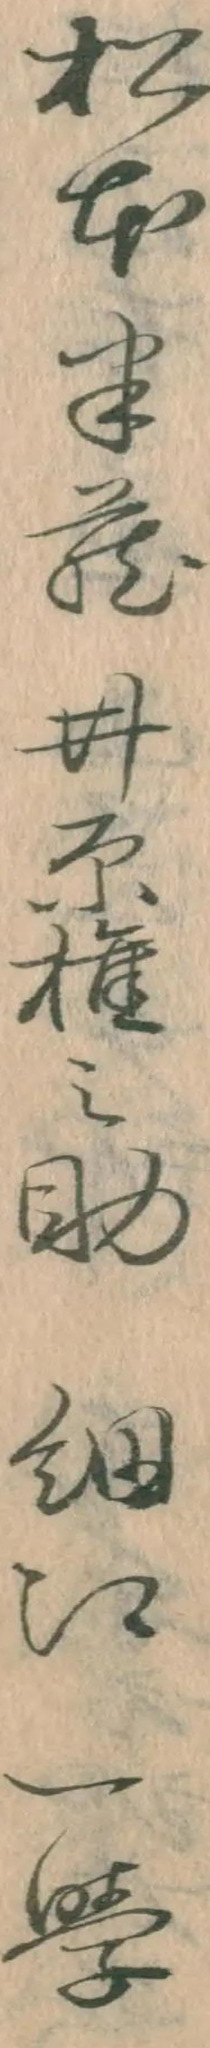松本半蔵井原権之助細江一学
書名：切支丹御退治記 49巻. [9]
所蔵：国立国会図書館 National Diet Library, JAPAN
